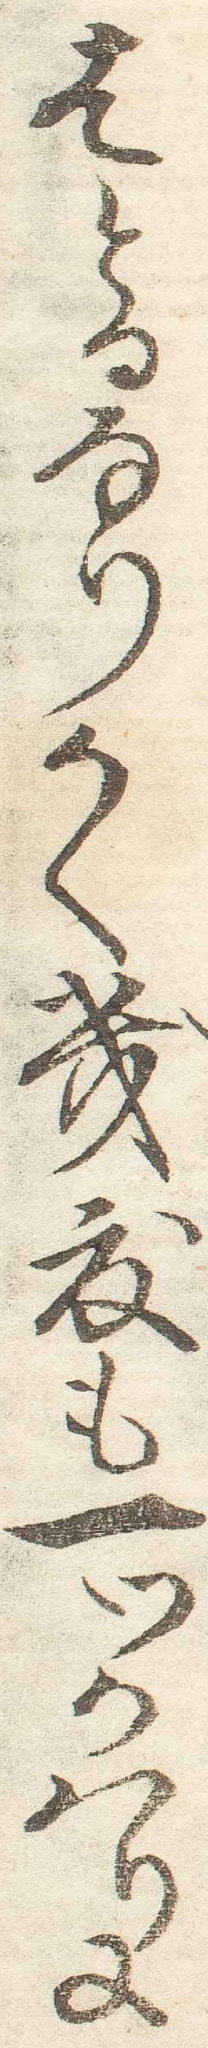はとるなりかく幾度も一ッかはりに

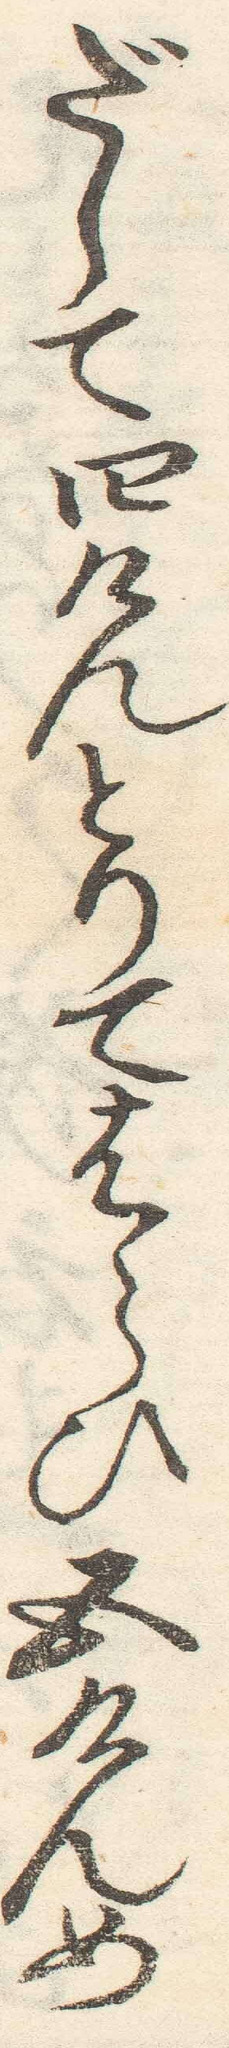だして四けんとりてはらひ五けんめ
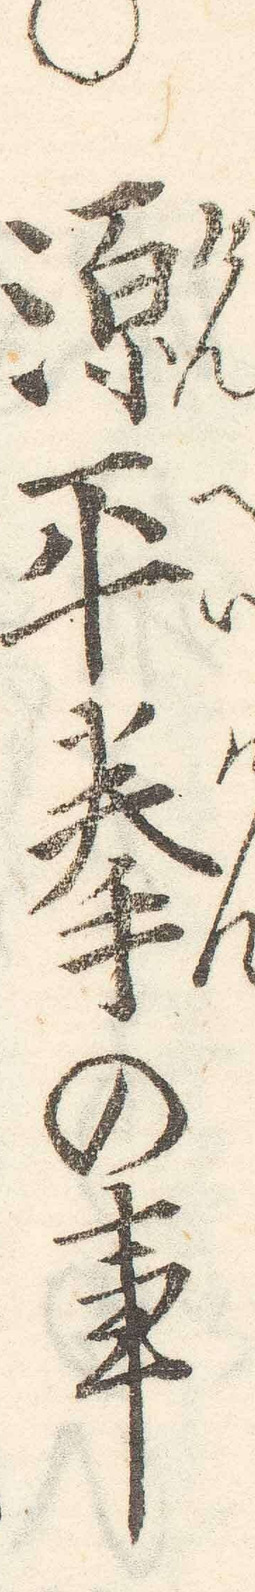○源平拳の事
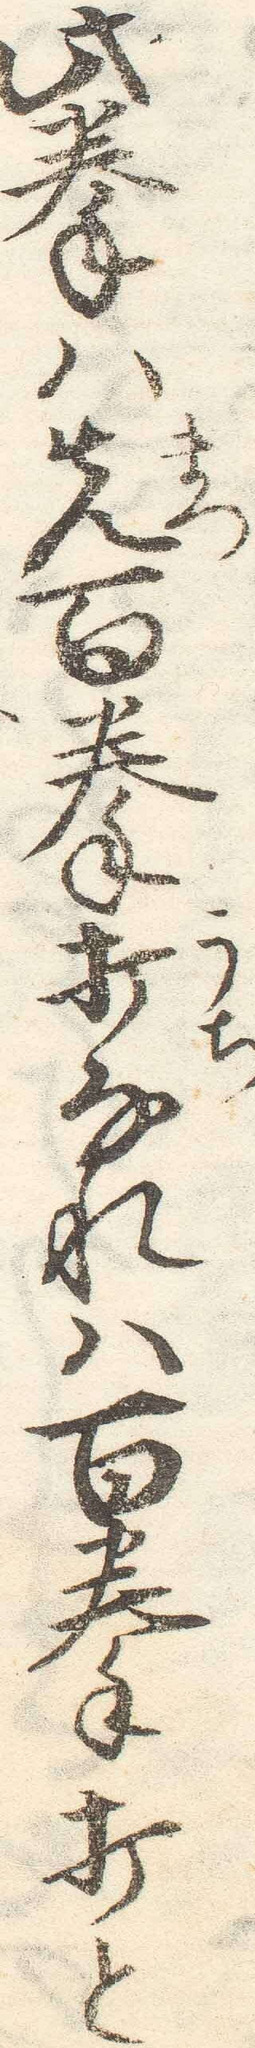此拳は先百拳打なれは百拳打と
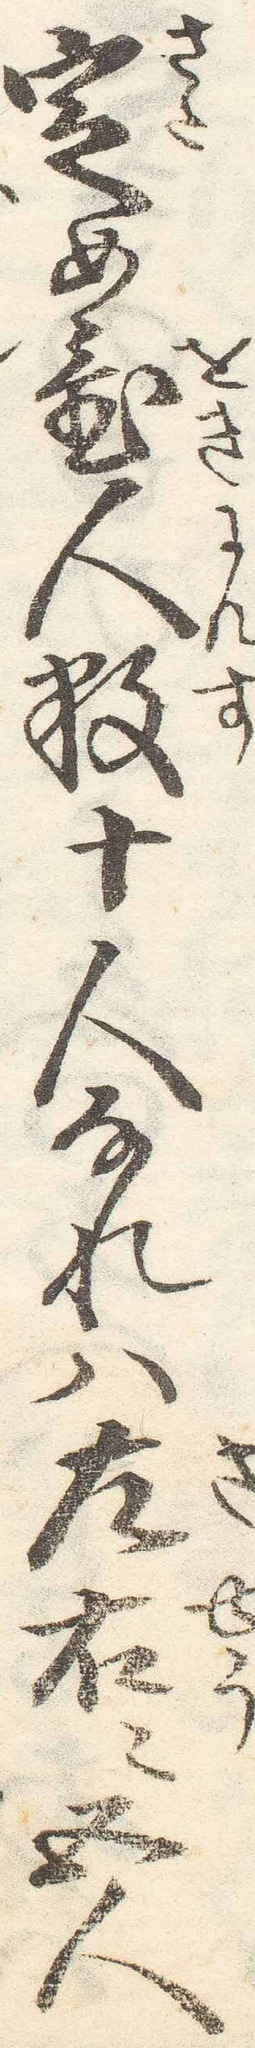定め置人数十人なれは左右に五人
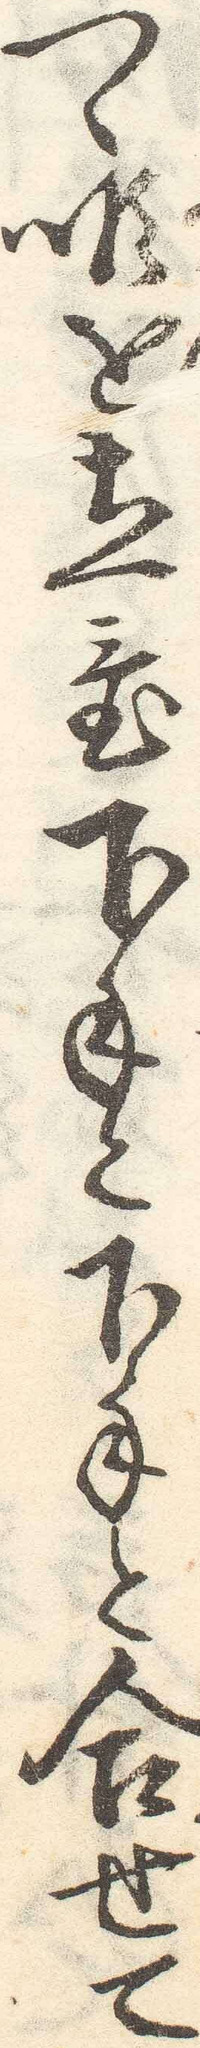つゝ順を立置下手と下手と合せて
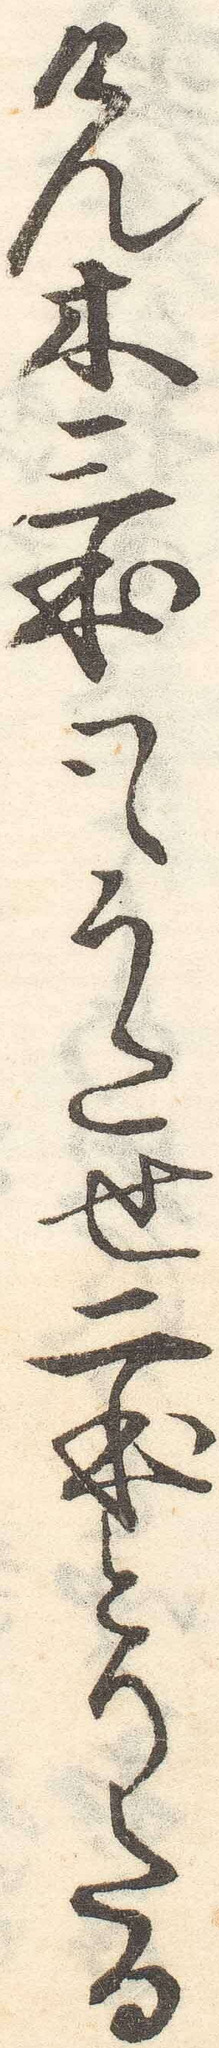けん木三本つゝうたせ二本とりたる
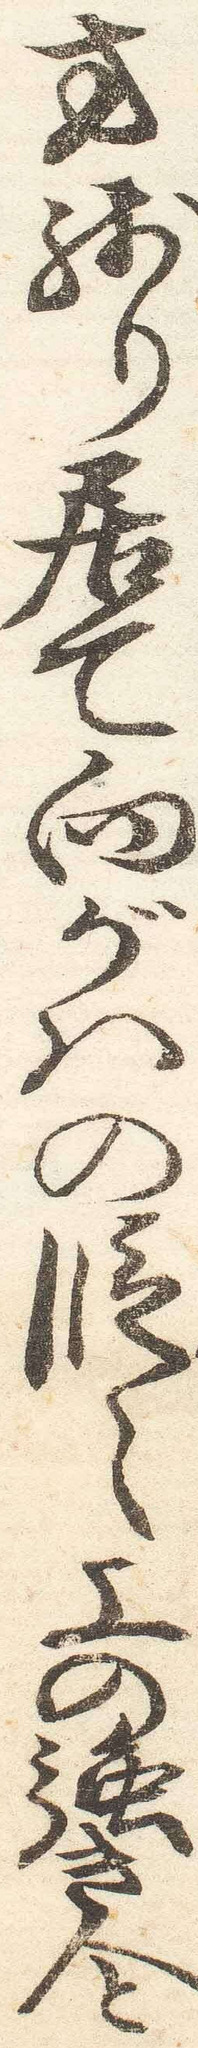方残り居て向がはの段々上の強き人と
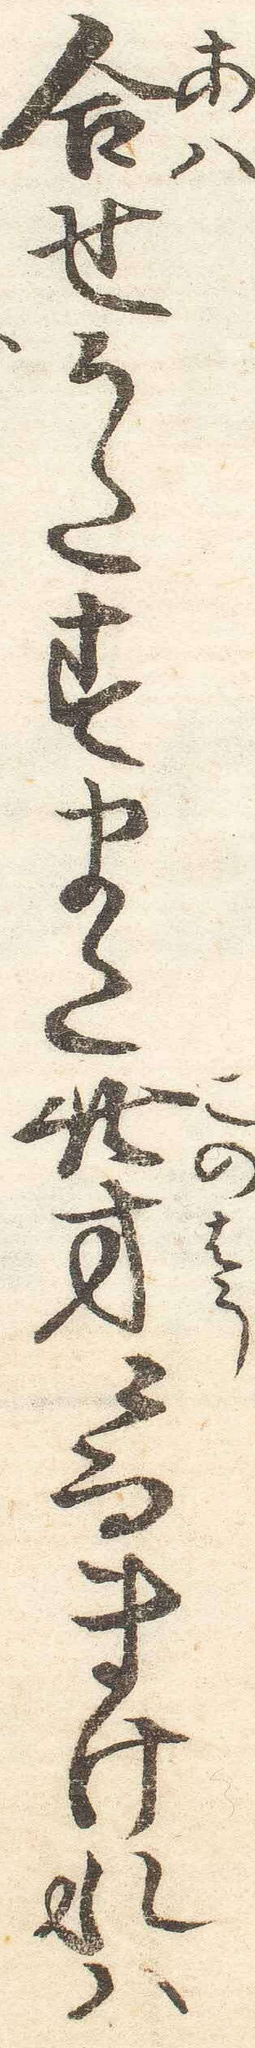合せかたすまた此方にてまけれは
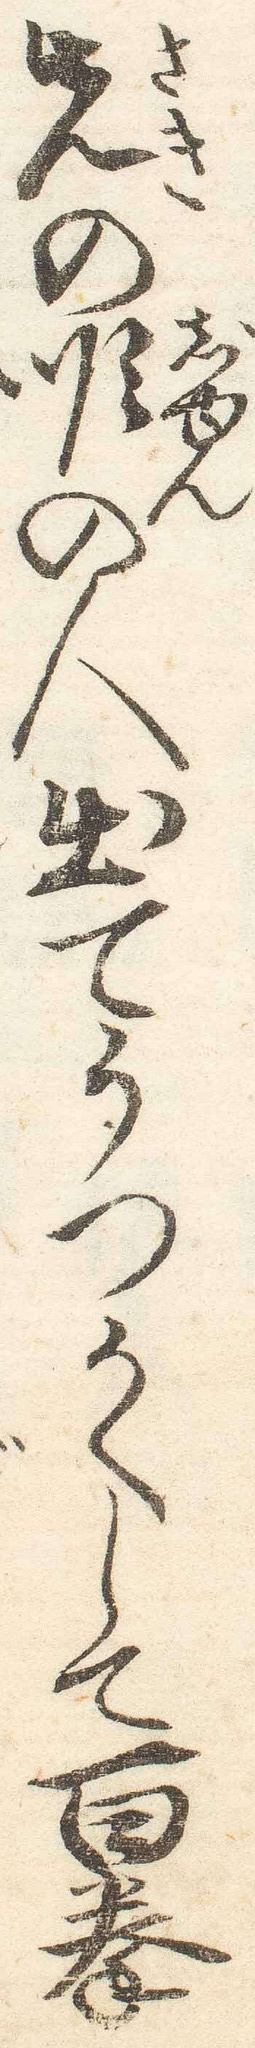先の順の人出てうつかくして百拳
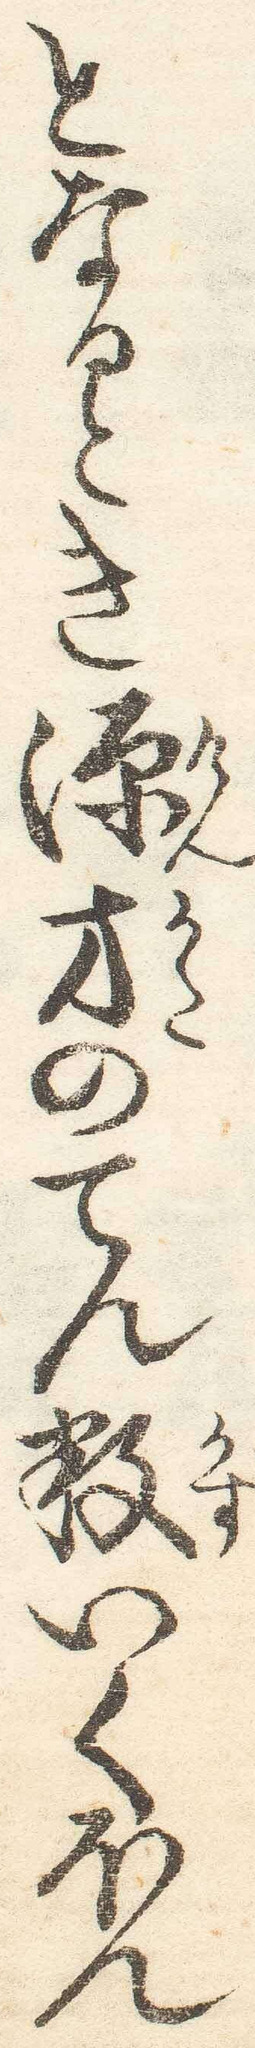となるとき源方のてん数いくほん
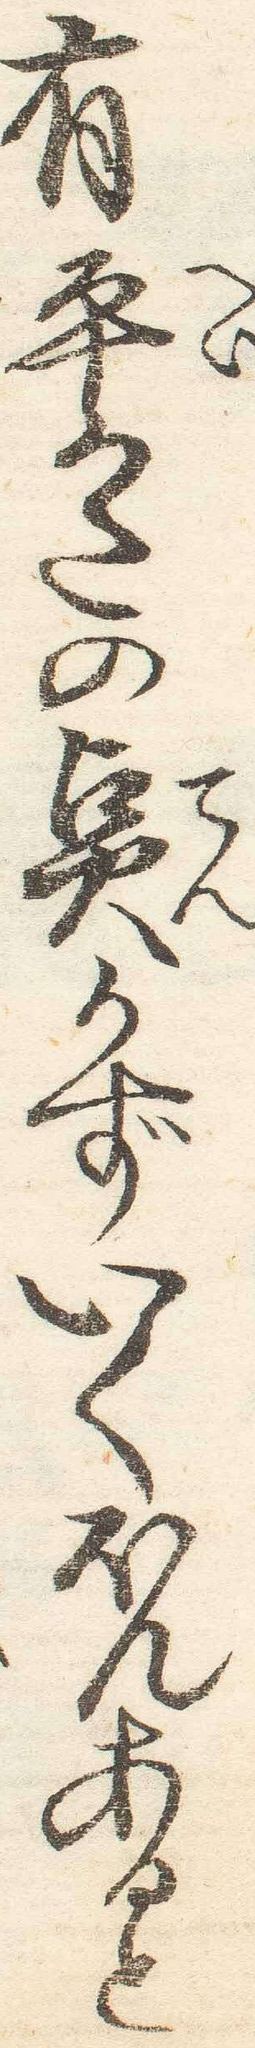有平かたの点かずいくほんあると
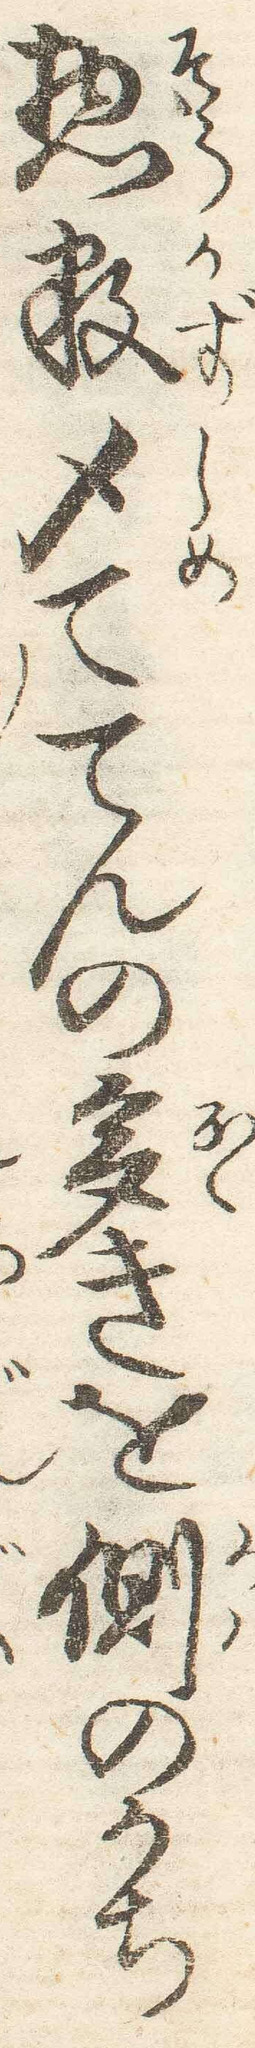惣数〆ててんの多きを側のかち
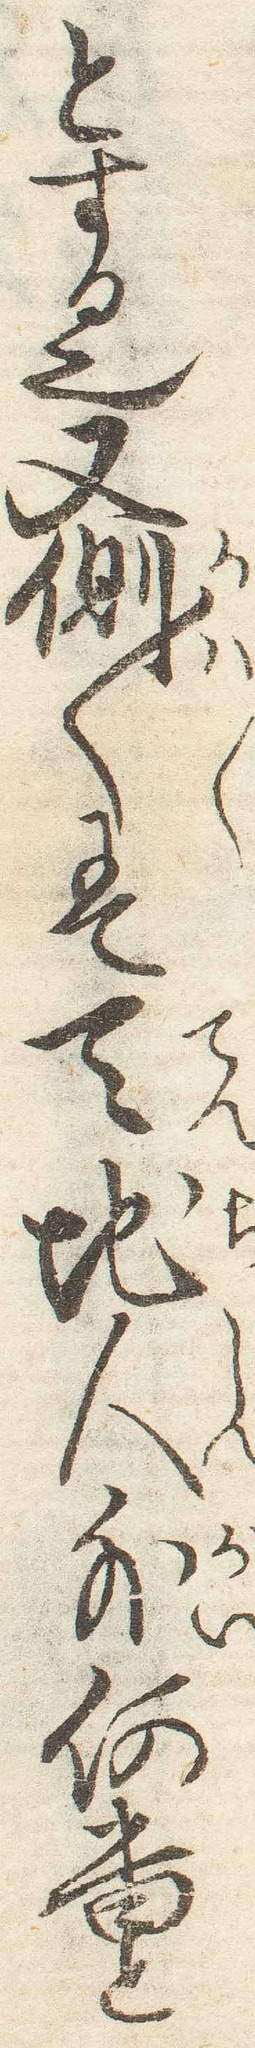とする也又側〳〵にて天地人外何番と

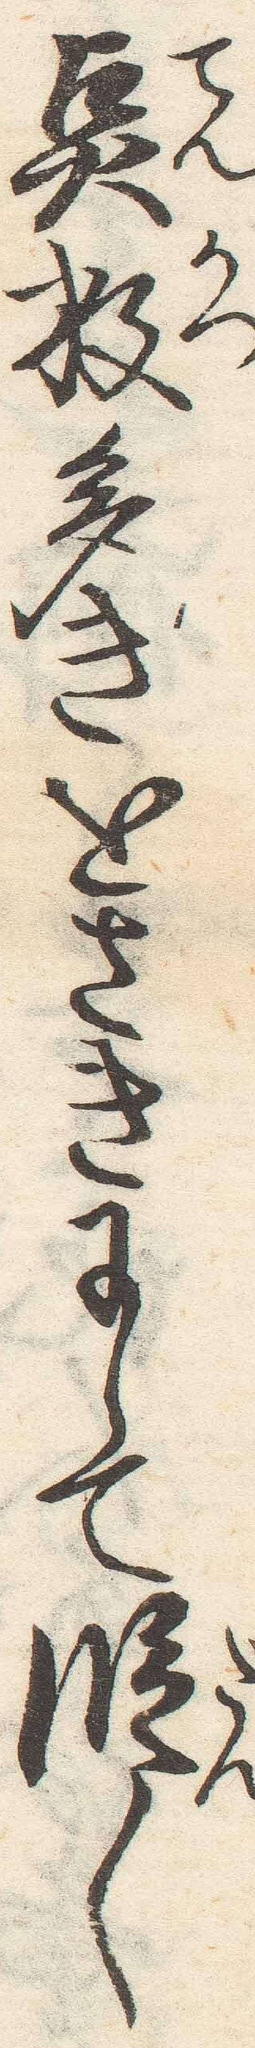点数多きをさきにして段〳〵
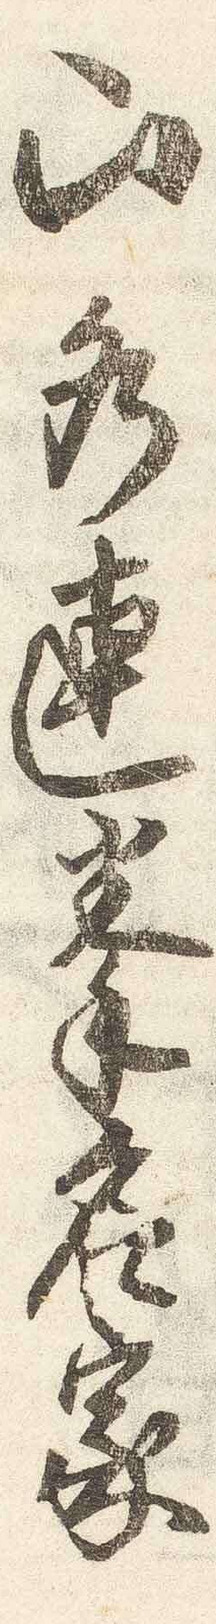山水連拳名家
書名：拳独稽古
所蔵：東京学芸大学附属図書館 国文学研究資料館
